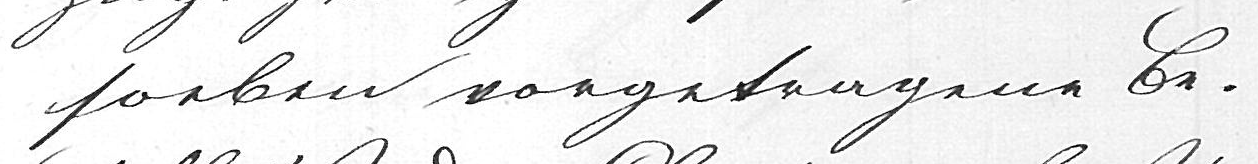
soeben vorgetragene Be-
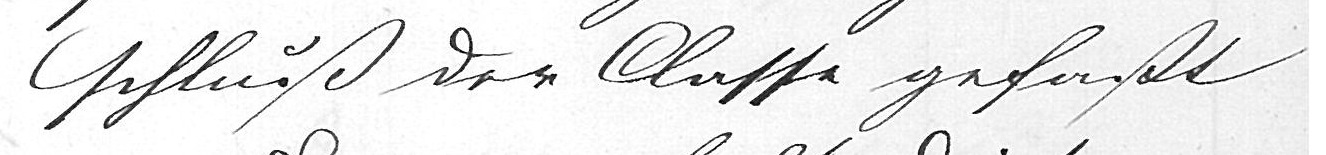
schluß der Classe gefaßt
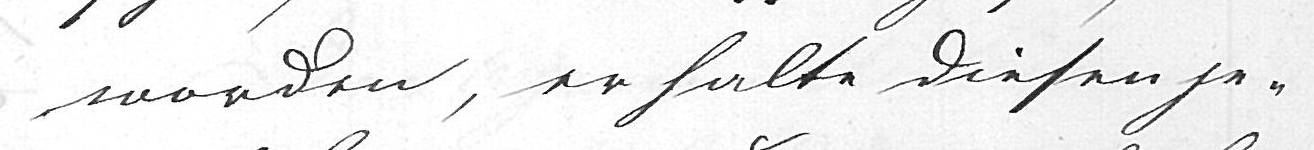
worden, er halte diesen je-
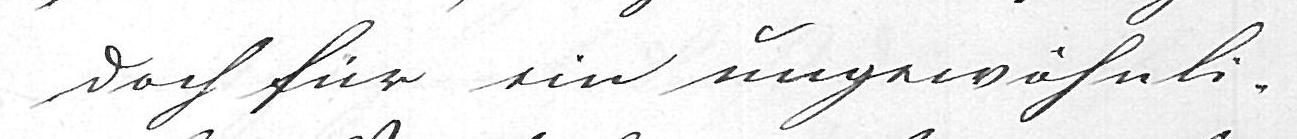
doch für ein ungewöhnli-
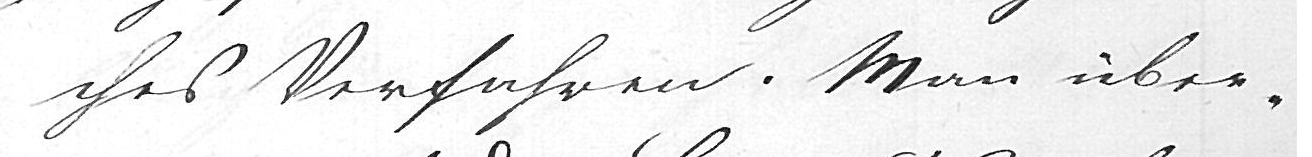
ches Verfahren. Man über-
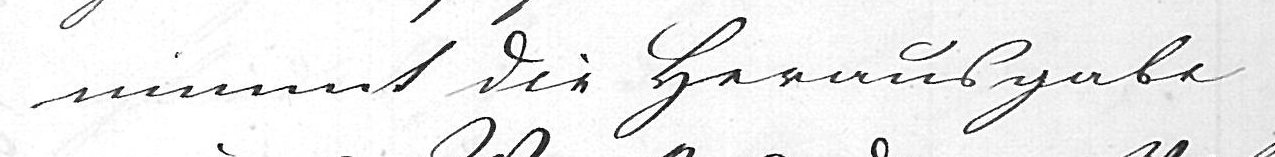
nimmt die Herausgabe
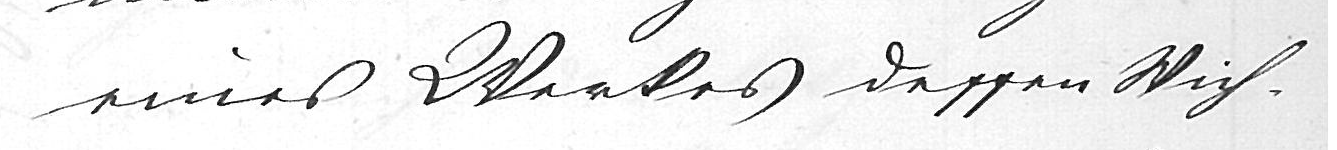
eines Werkes dessen Wich-
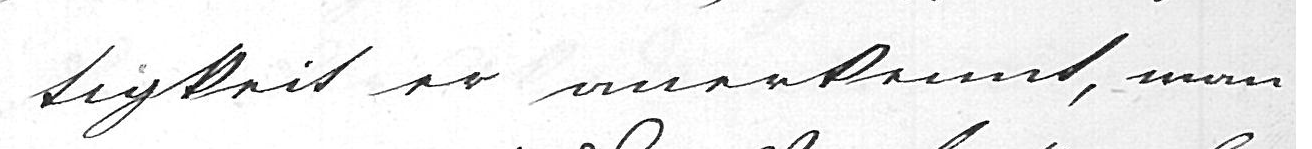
tigkeit er anerkennt, man
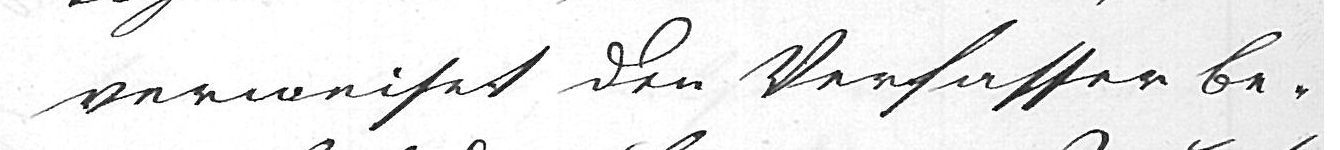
verweiset den Verfasser be-
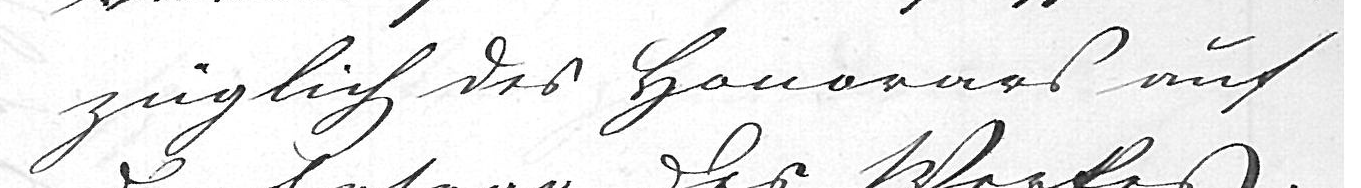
züglich des Honorars auf
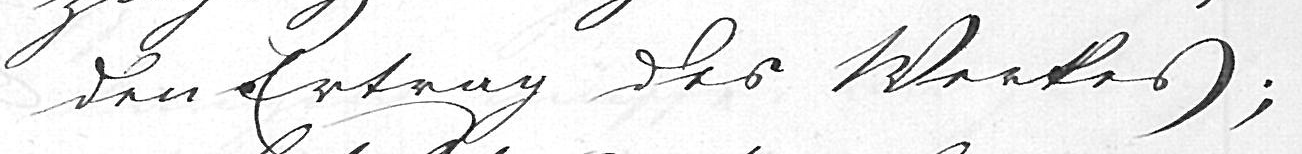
den Ertrag des Werkes;
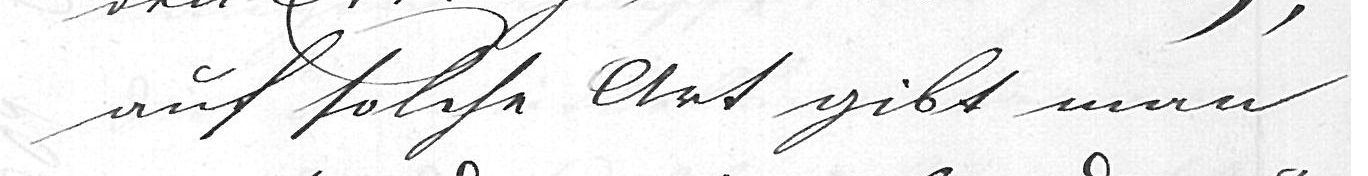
auf solche Art gibt man
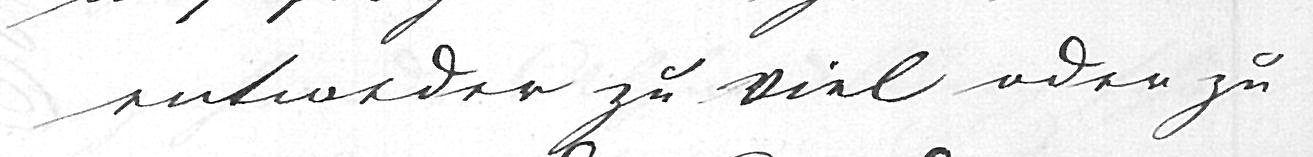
entweder zu viel oder zu
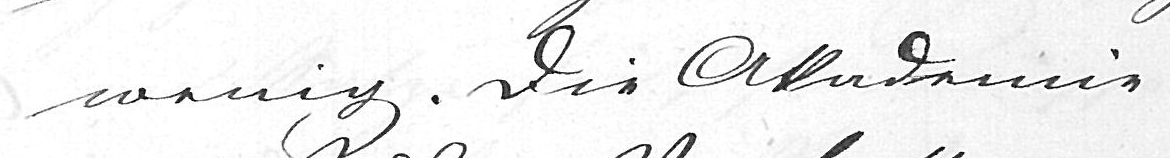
wenig. Die Akademie
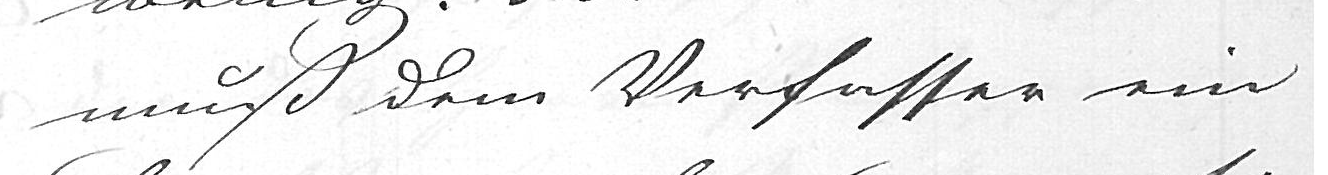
muß dem Verfasser ein
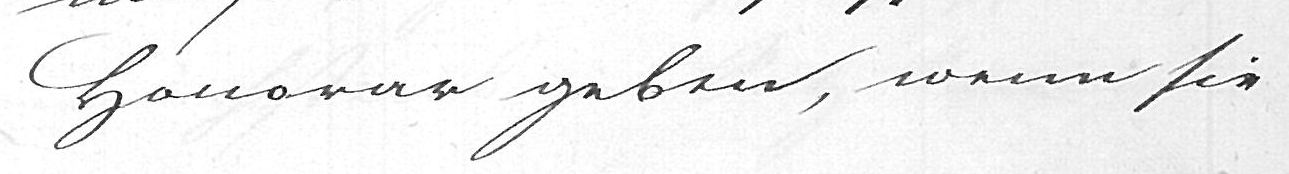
Honorar geben, wenn sie
